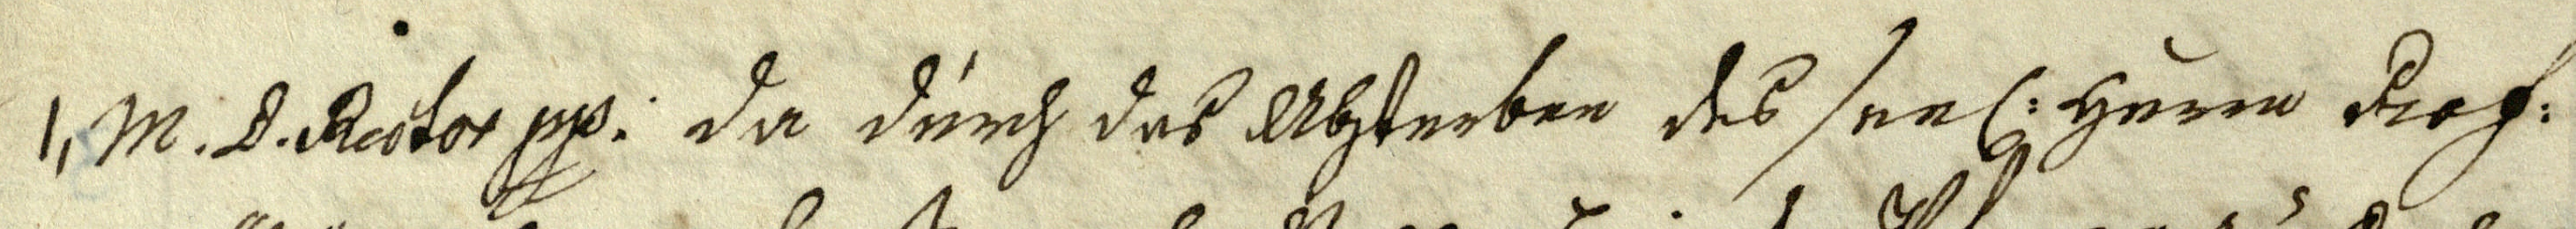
1. M. D. Rector pp. Da durch das Absterben des seel. Herrn Prof.
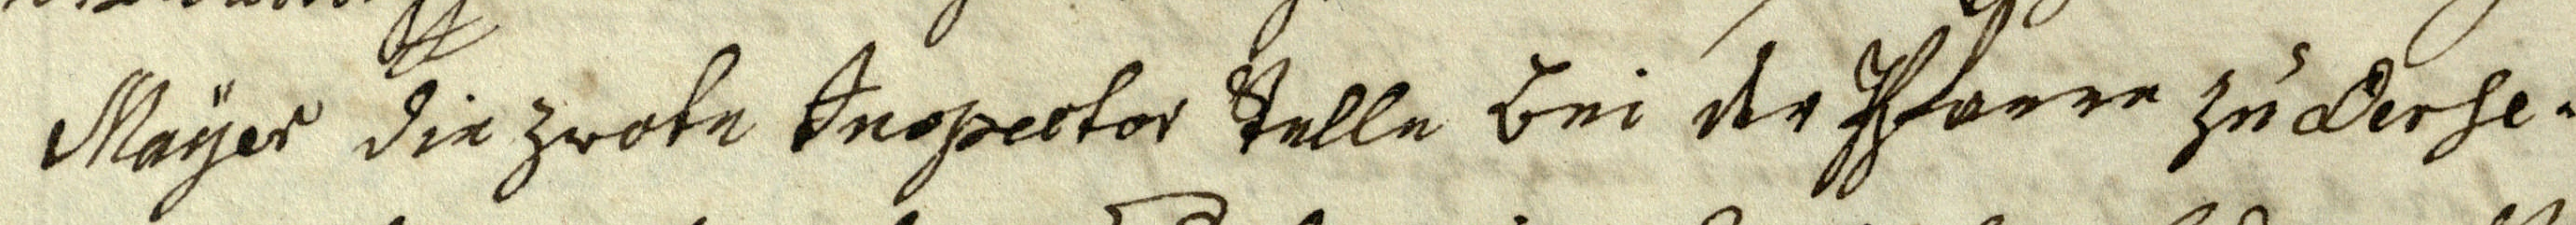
Maÿer die zwote Inspector Stelle bei der Pfarre zu Derse¬
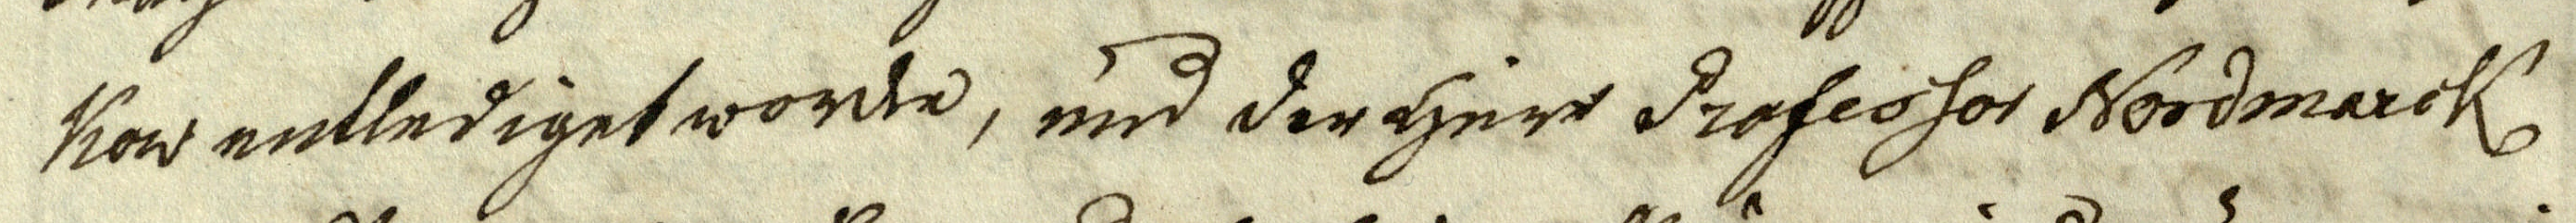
kow entlediget worden, und der Herr Professor Nordmarck
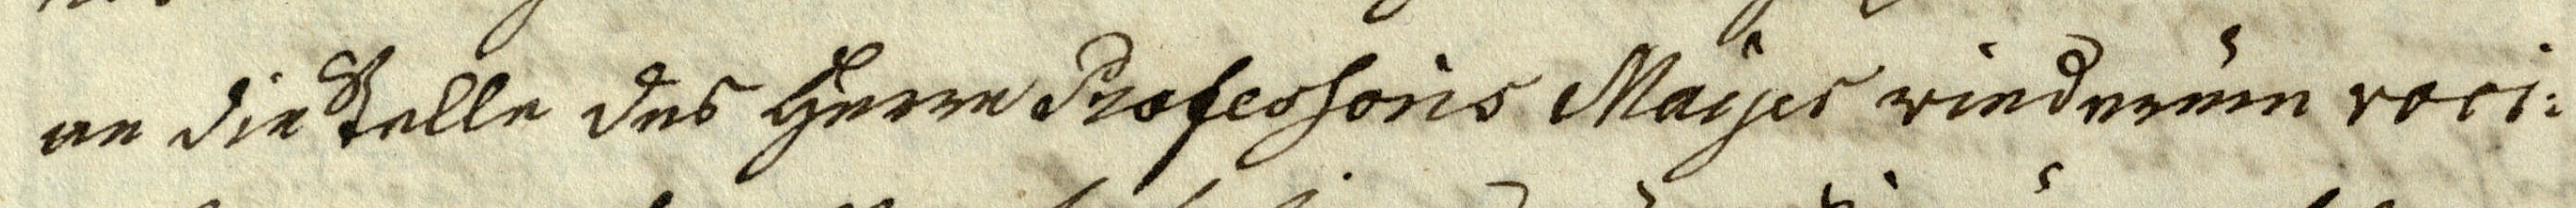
an die Stelle des Herrn Professoris Maÿer wiederum voci¬
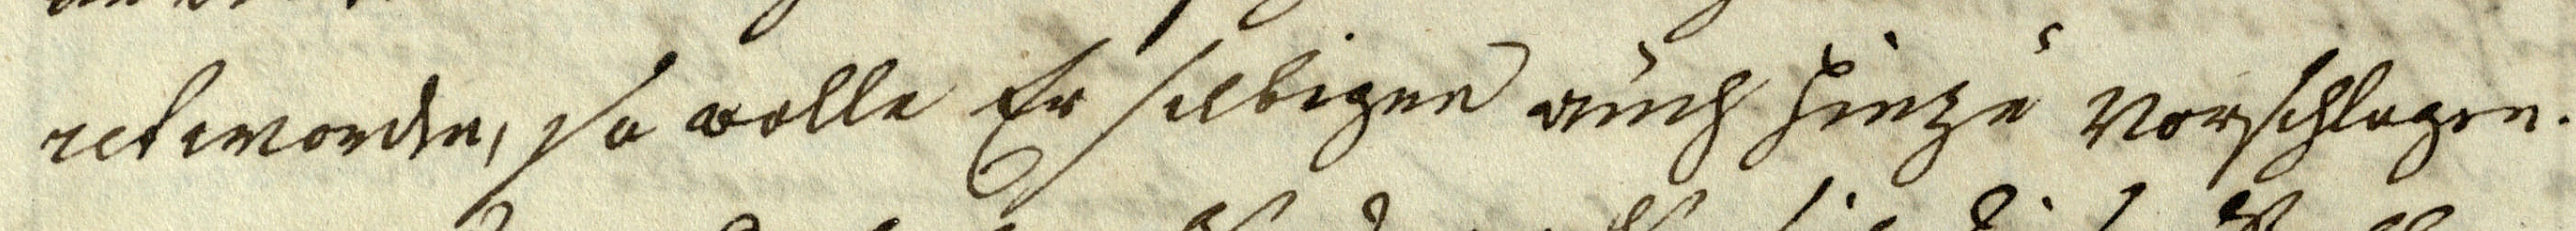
ret worden, so wolle Er selbigen auch hiezu vorschlagen.
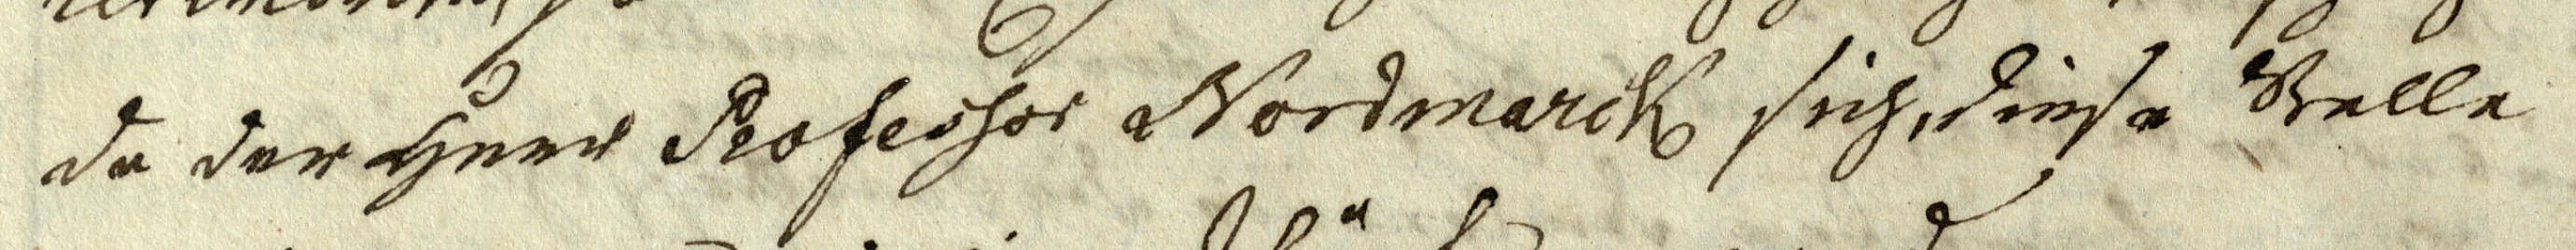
Da der Herr Professor Nordmarck sich, diese Stelle
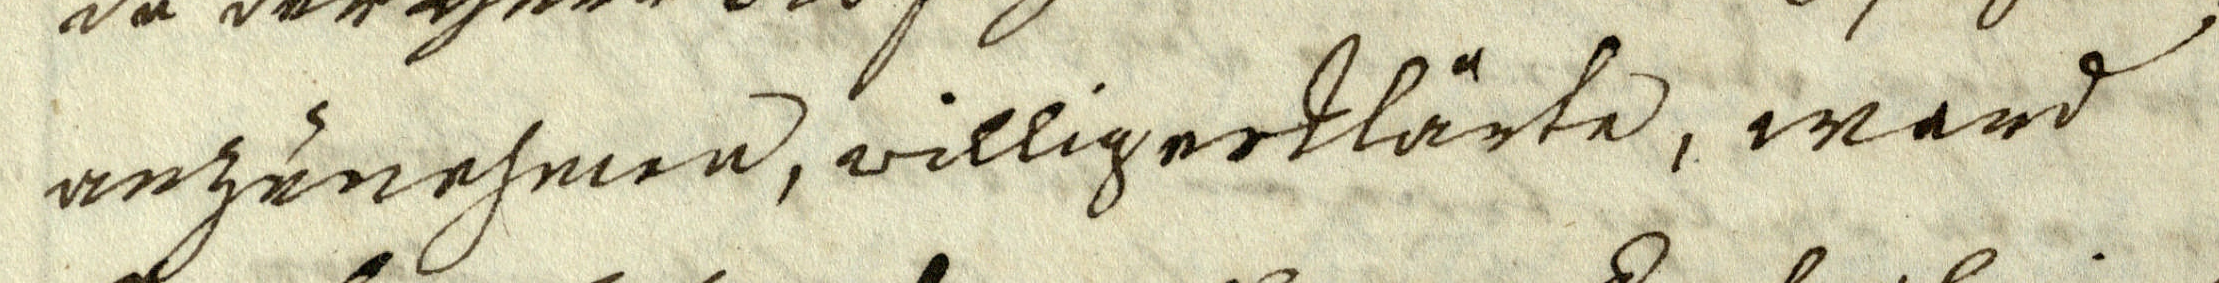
anzunehmen, willig erklärte, ward
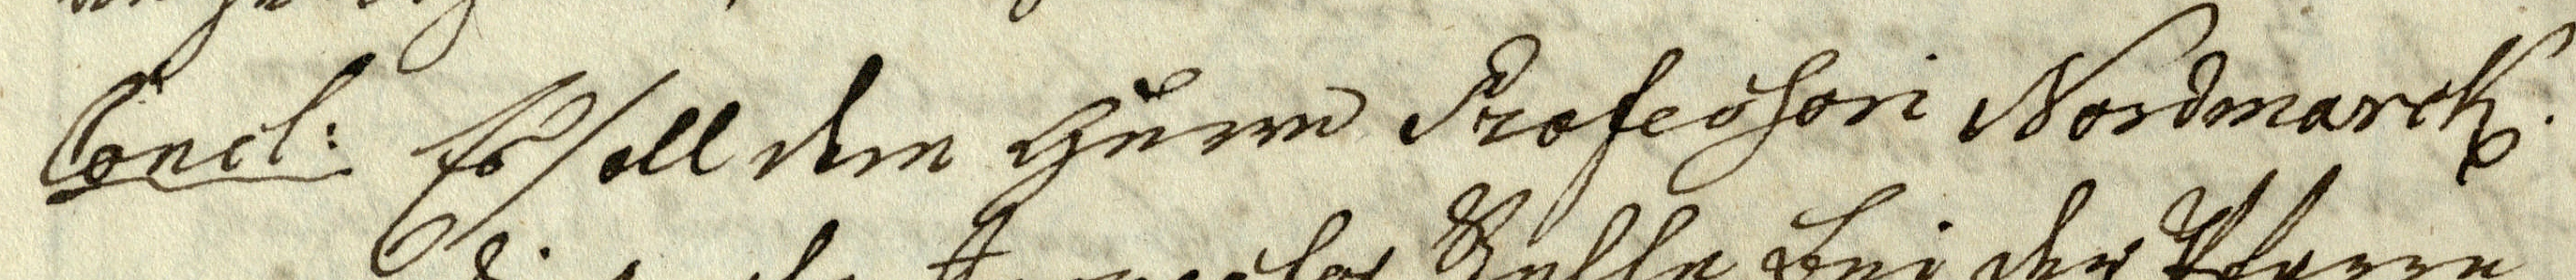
Concl. Es soll dem Herrn Professori Nordmarck
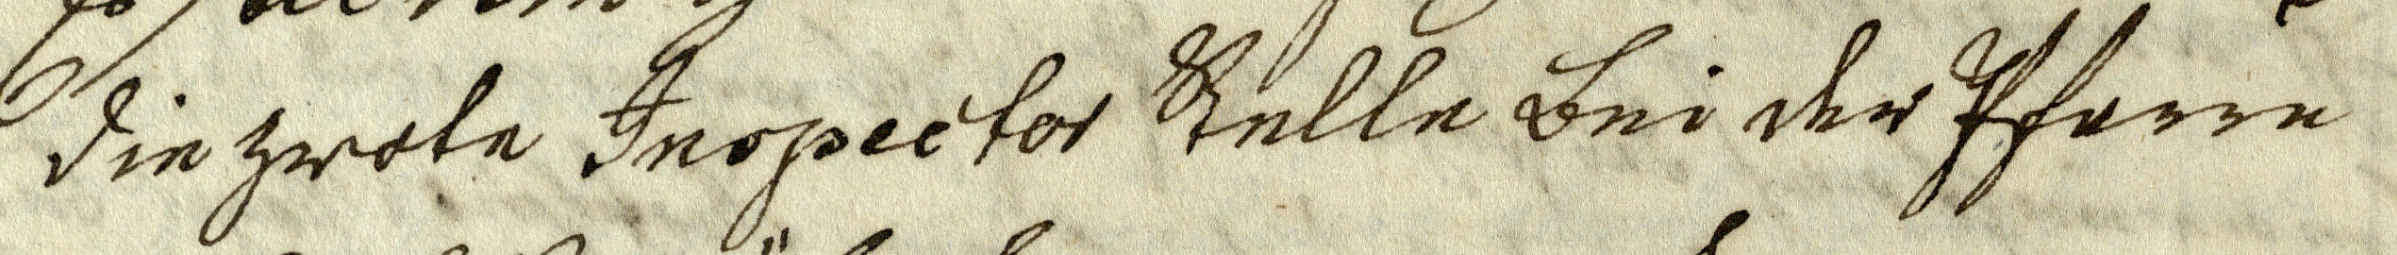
die zwote Inspector Stelle bei der Pfarre
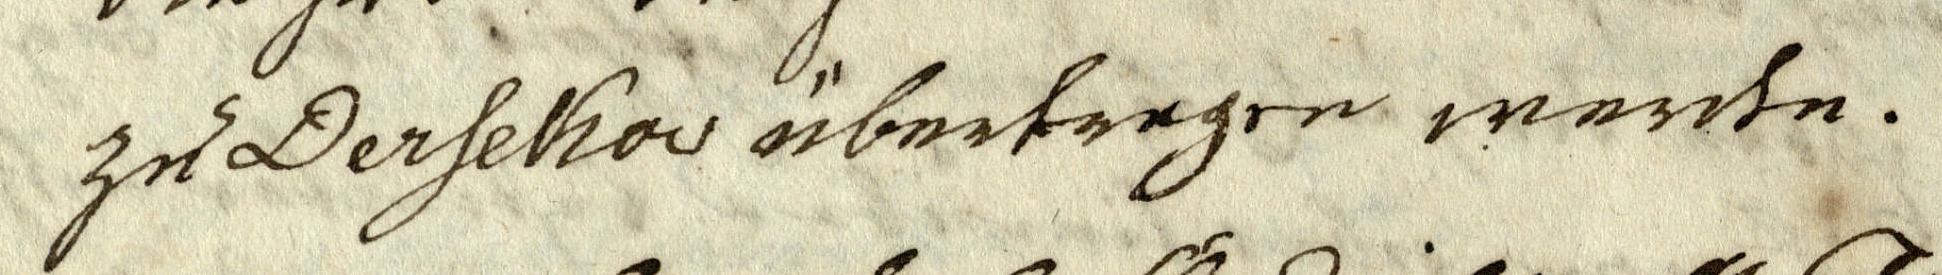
zu Dersekow übertragen werden.
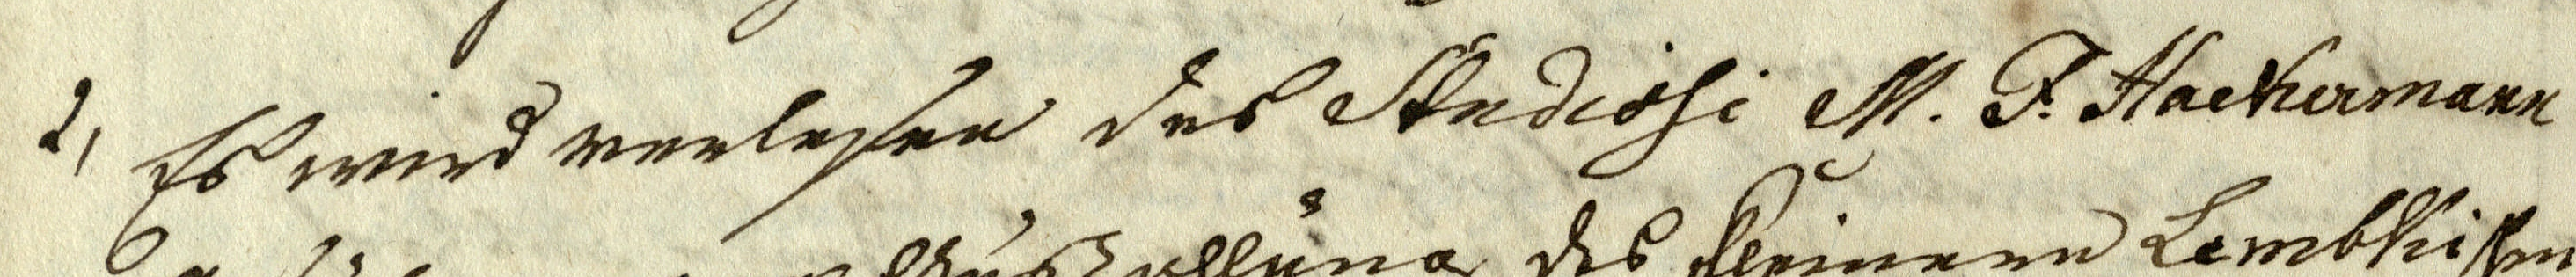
2, Es wird verlesen des Studiosi M. J. Haekermann
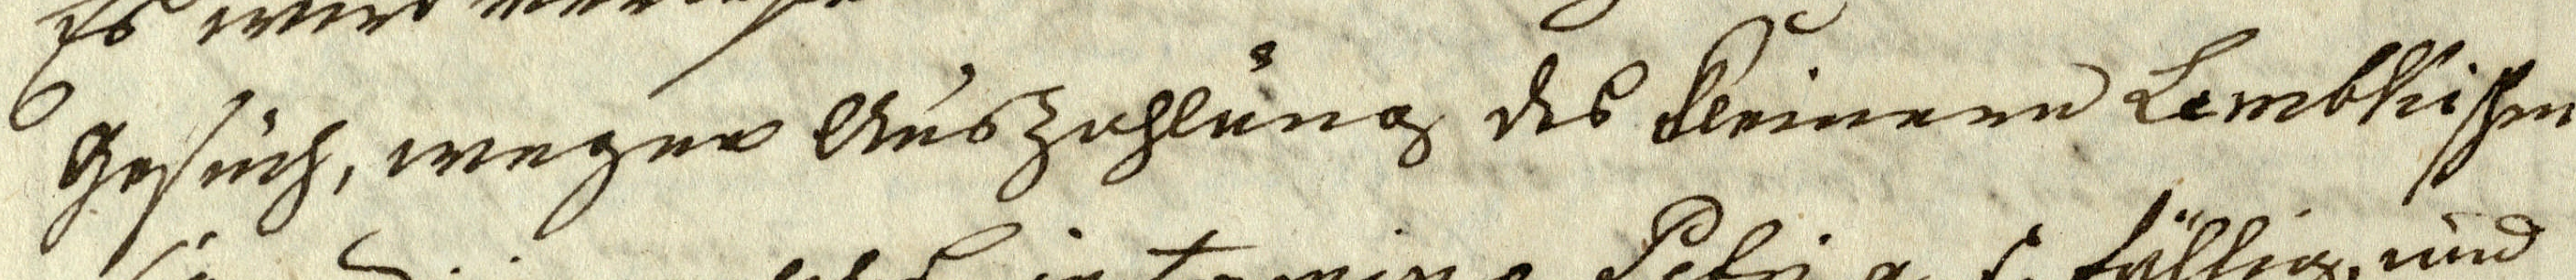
Gesuch, wegen Auszahlung des kleinen Lembkischen
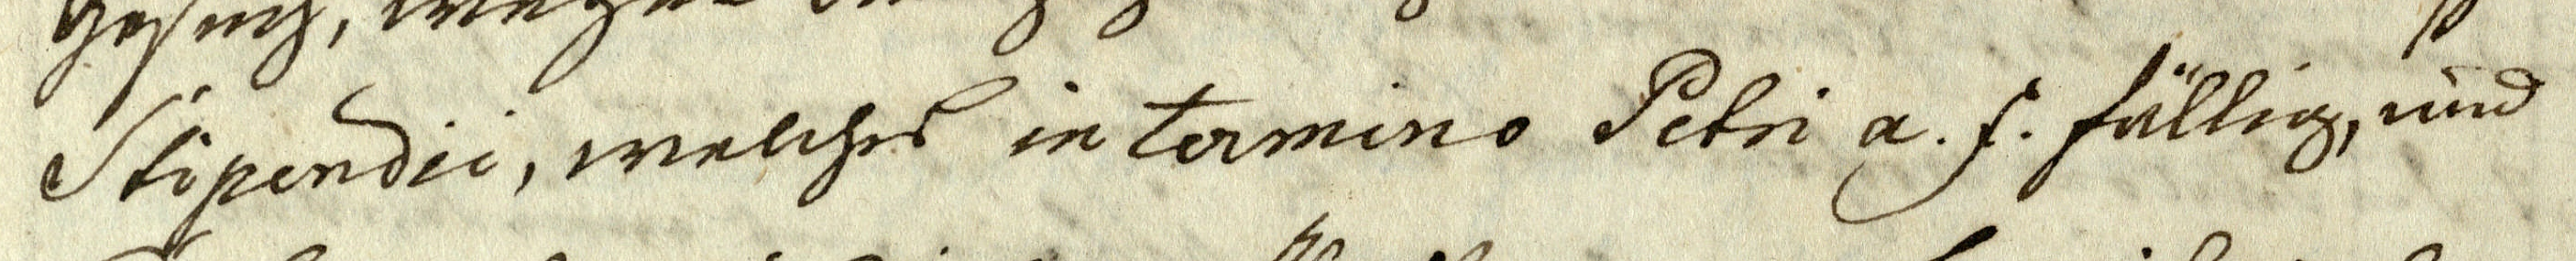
Stipendii, welches in termino Petri a. f. fällig, und
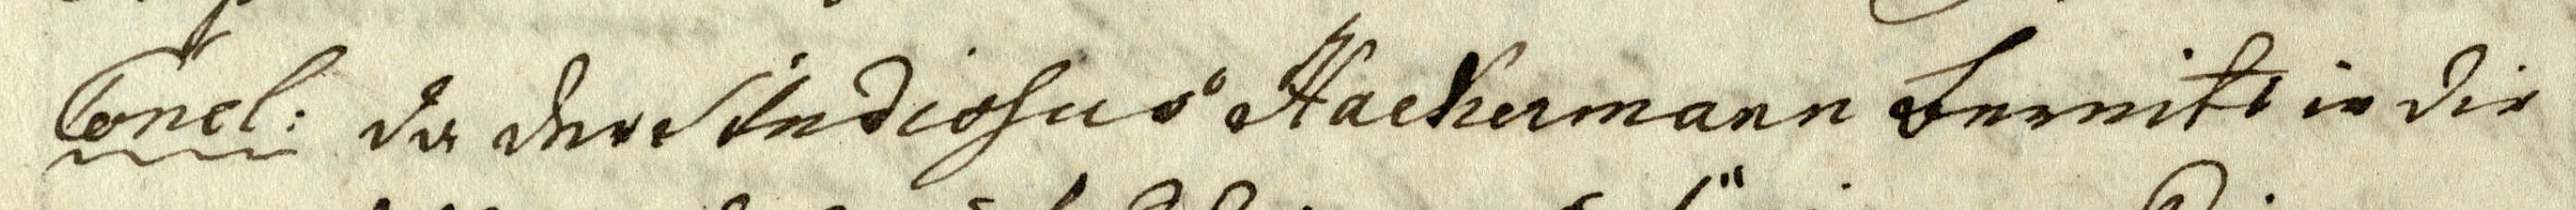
Concl. da der Studiosus Haekermann bereits in die
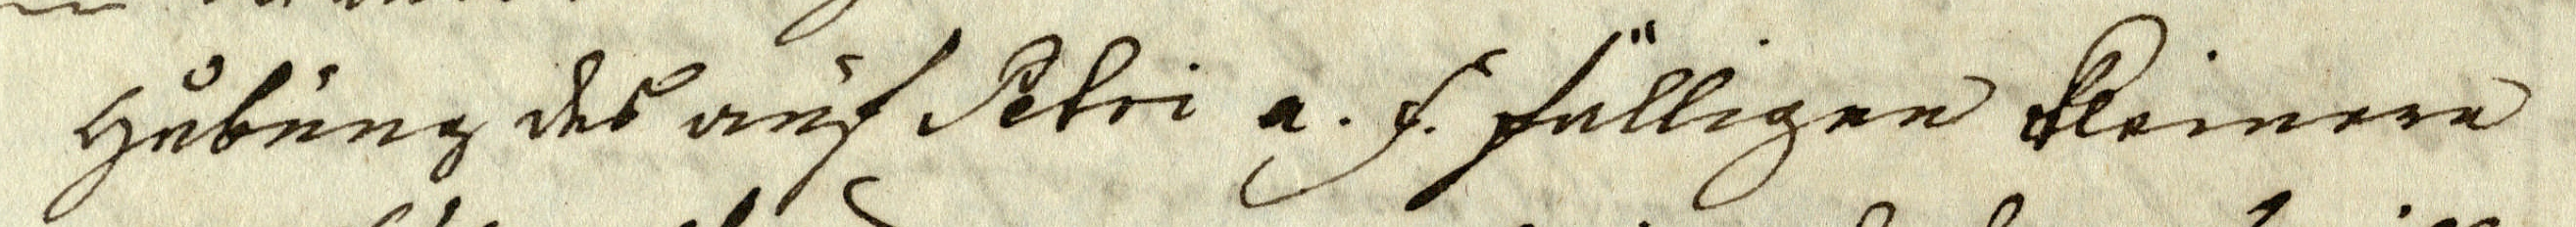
Hebung des auf Petri a. f. fälligen kleinen
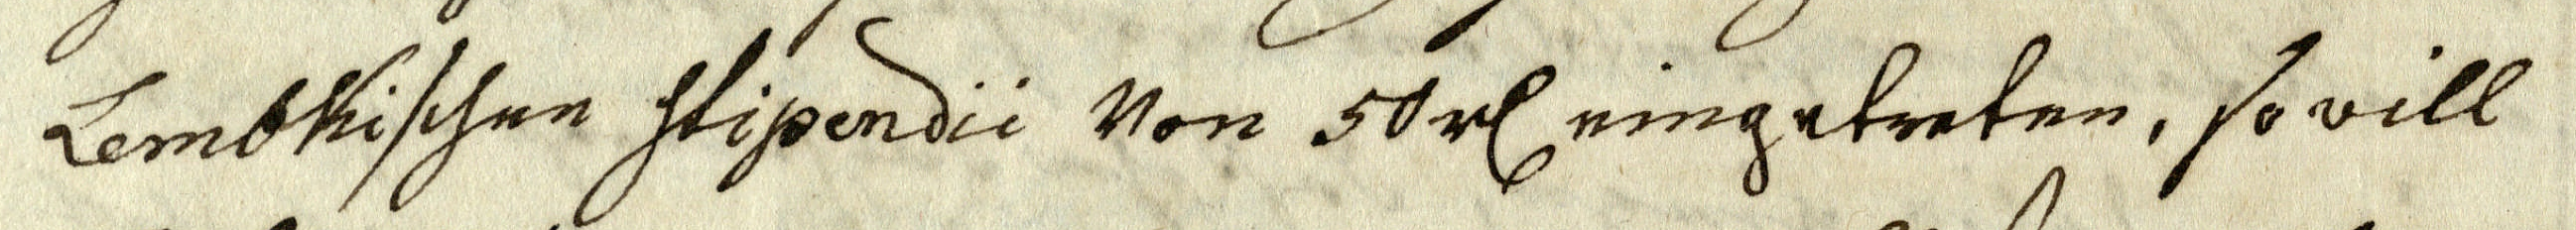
Lembkischen Stipendii von 50 r. eingetreten, so will
